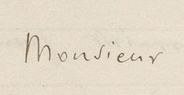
Monsieur
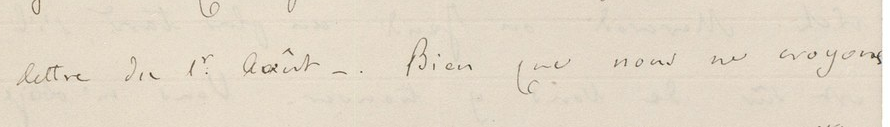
lettre du 1r Août –.. Bien que nous ne croyons
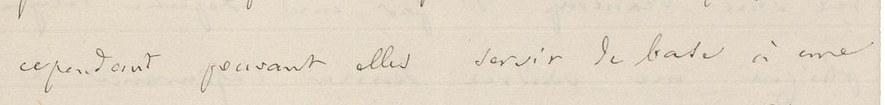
cependant pouvant elles servir de base à une
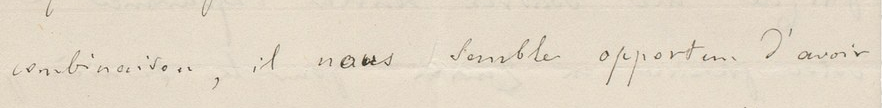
combinaison, il nous semble opportun d'avoir
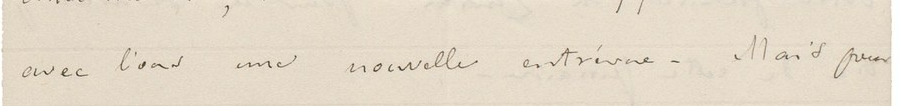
avec Vous une nouvelle entrévue – Mais pour
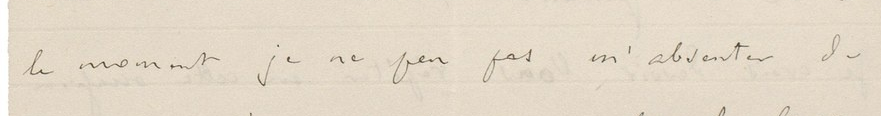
le moment je ne peu pas m'absenter de
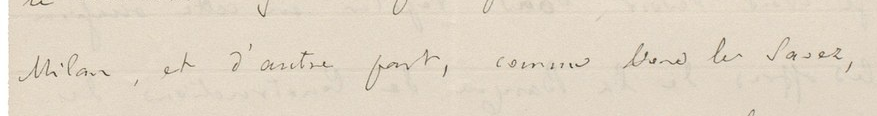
Milan, et d'autre part, comme Vous le savez,
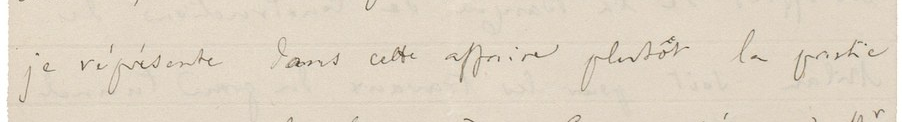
je réprésente dans cette affaire plutôt la partie
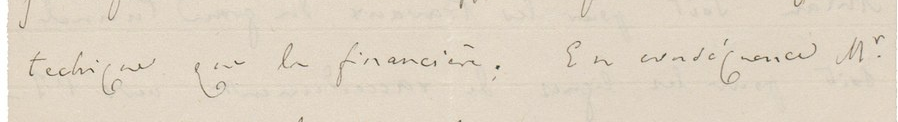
technique que la financière. En conséquence Mr
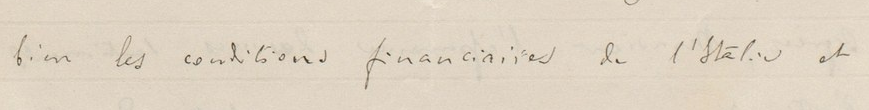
bien les conditions financiaires de l'Italie et
